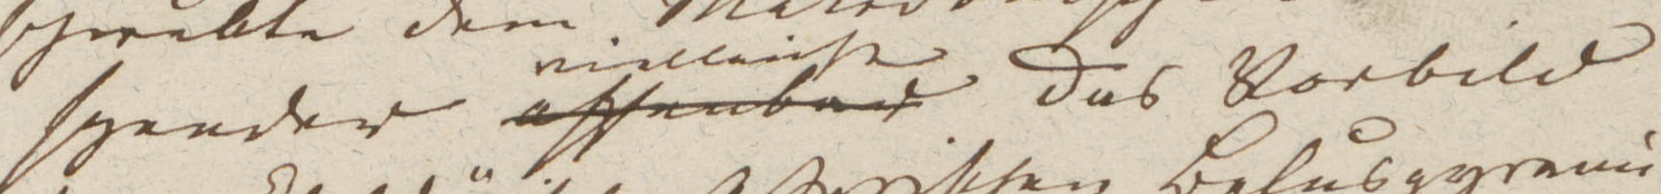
spender offenbar vielleicht das Vorbild
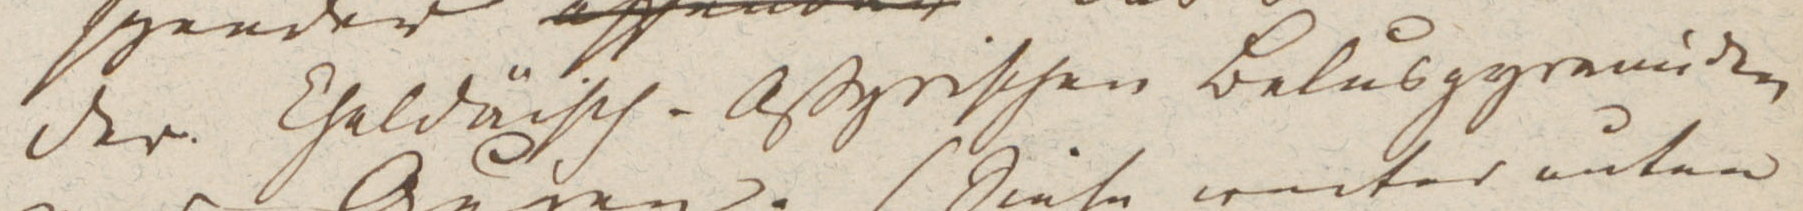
der Chaldäisch-Assyrischen Beluspyramiden
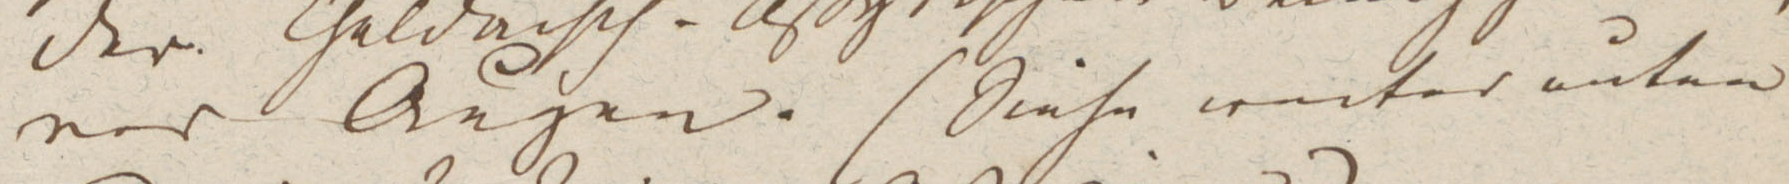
vor Augen. (Siehe weiter unten
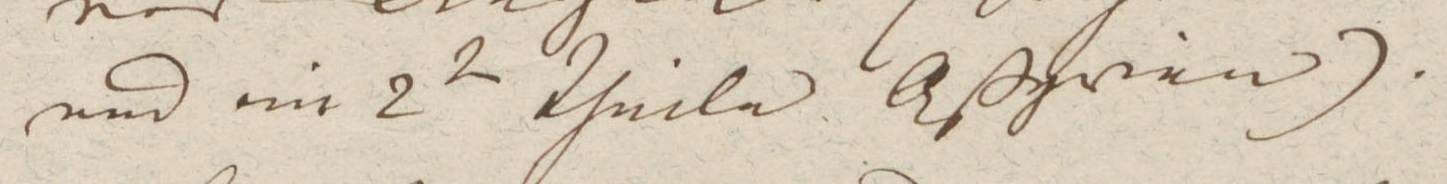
und im 2t Theile Assyrien).
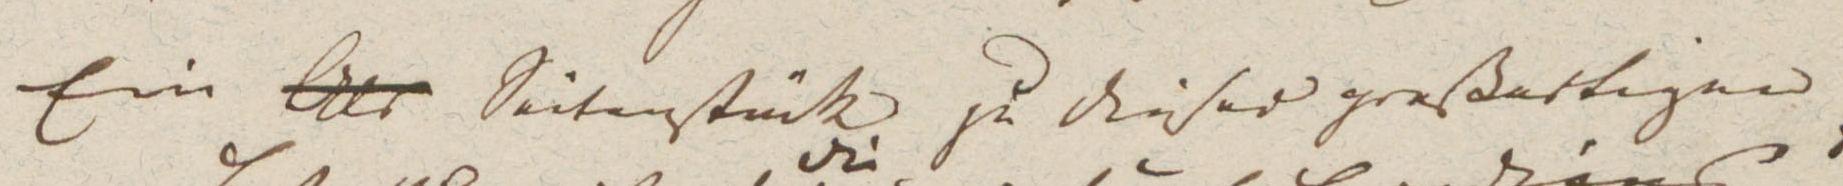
Ein Als Seitenstück zu dieser grossartigen
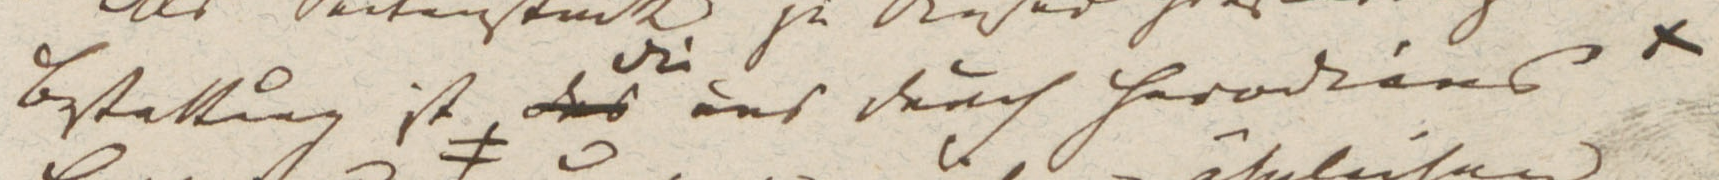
Bestattung ist das die uns durch Herodians %
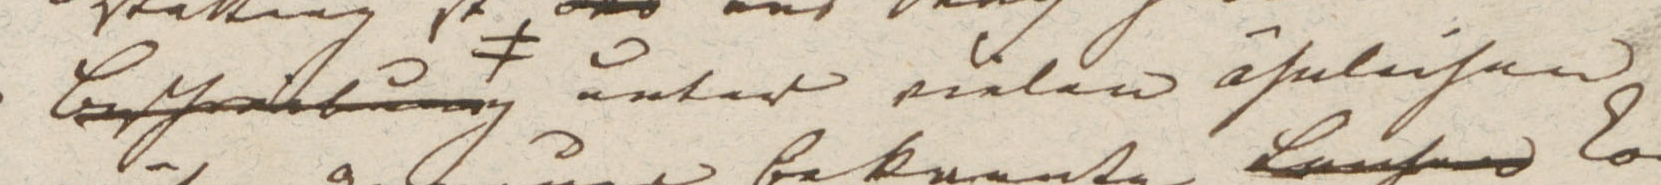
Beschreibung % unter vielen ähnlichen
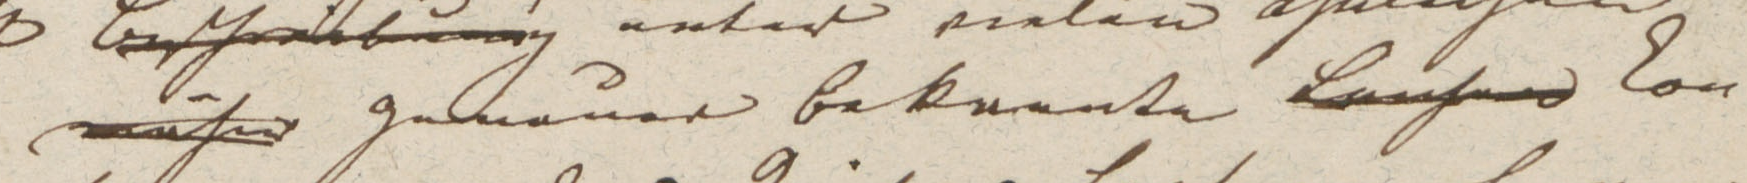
näher genauer bekannte Leichen Con-
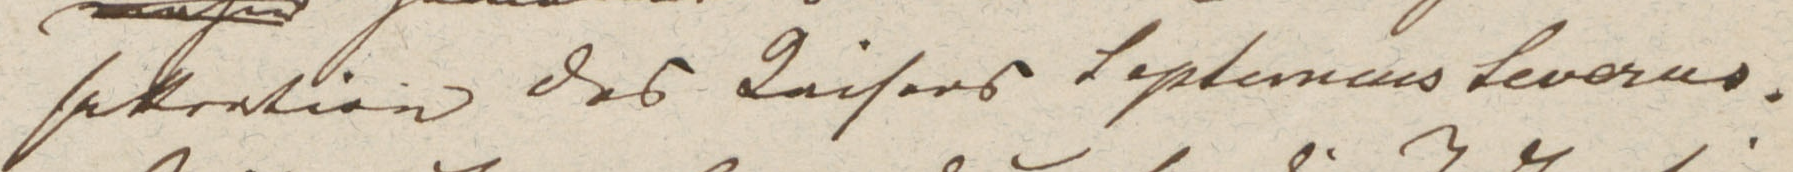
sekration des Kaisers Septimius Severus.
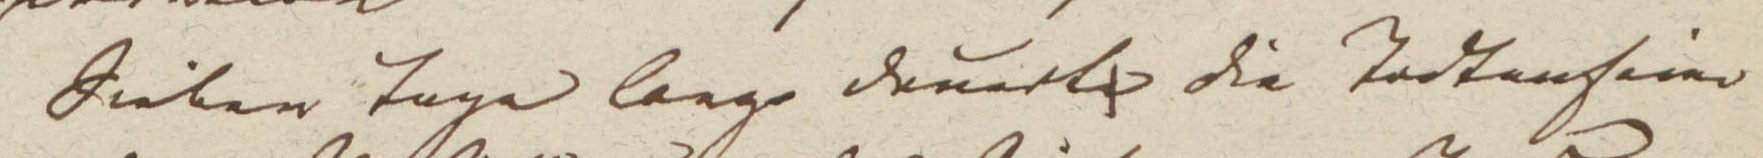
Sieben Tage lang dauerte die Todtenfeier
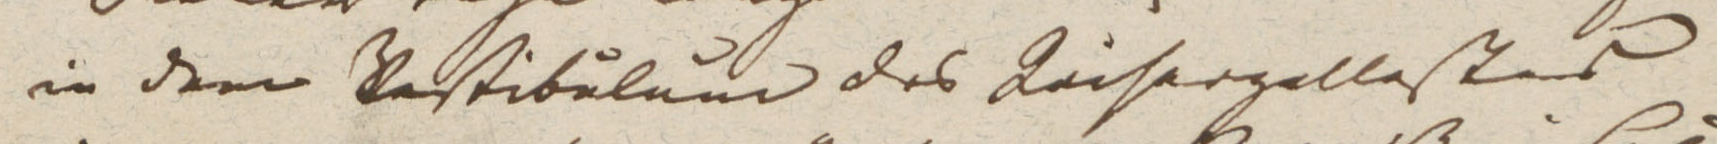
in dem Vestibulum des Kaiserpallastes
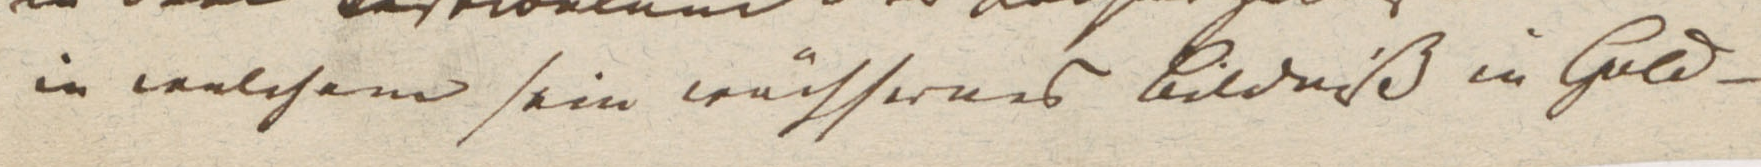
in welchem sein wächsernes Bildniss in Gold-
